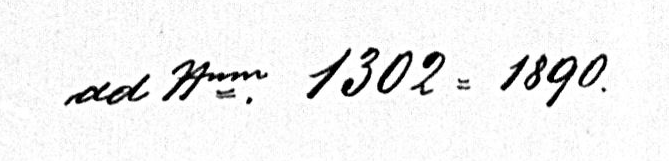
ad Num. 1302=1890.
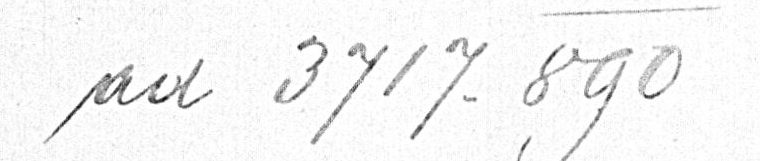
ad 3717. 890
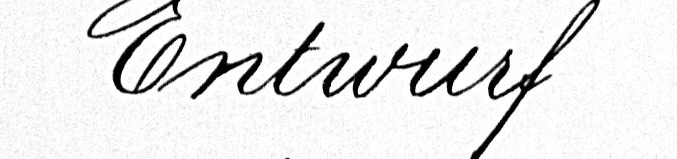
Entwurf
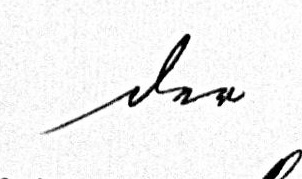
der
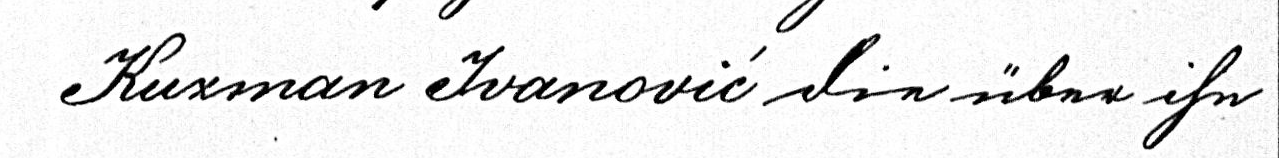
Kuzman Ivanović die über ihn
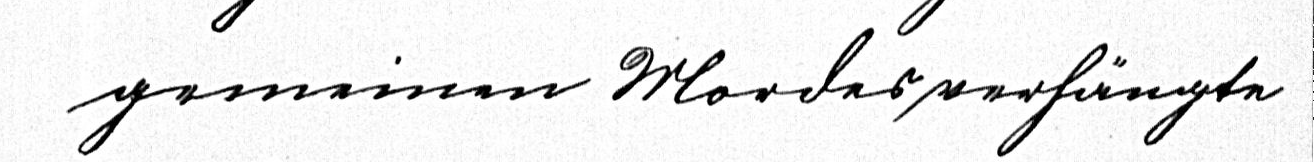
gemeinen Mordesverhängte
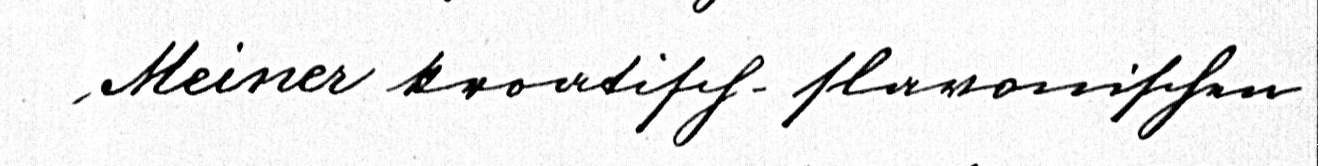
Meiner kroatisch-slavonischen
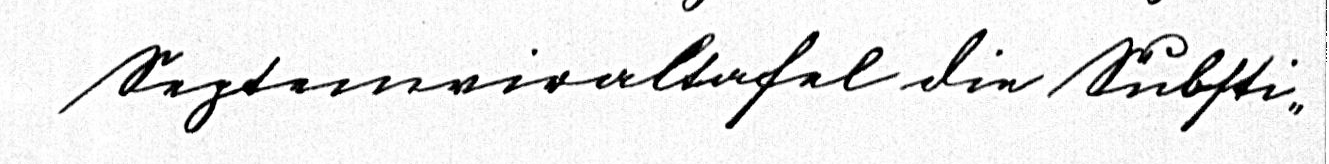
Septemviraltafel die Substi¬
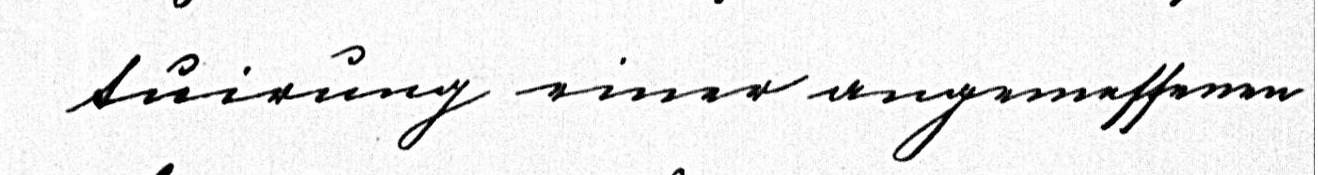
tuierung einer angemessenen
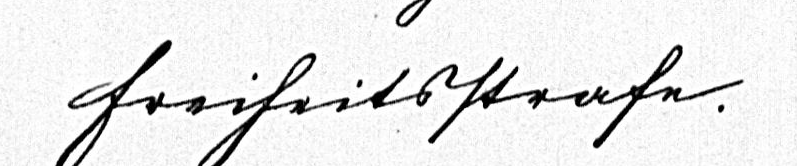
Freiheitsstrafe.
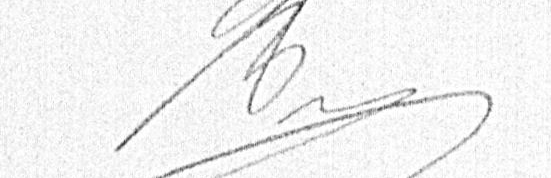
xx
